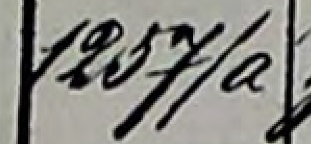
1257/a
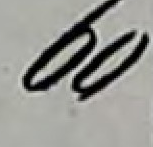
60
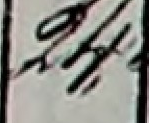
24
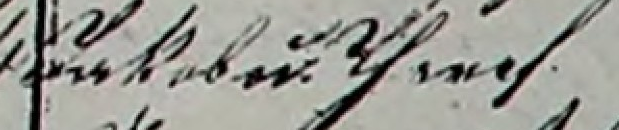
Jakob u Theres.
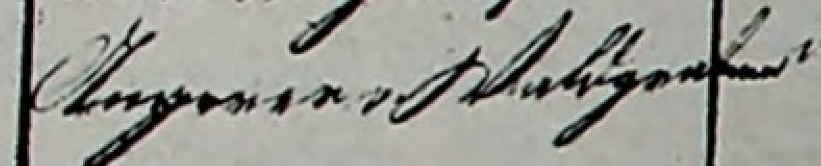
Angerer v. Waldgraben
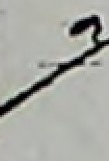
7
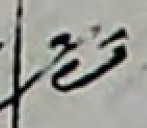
75
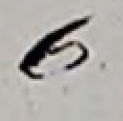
6
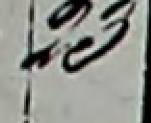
23
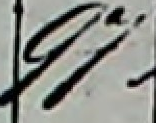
97
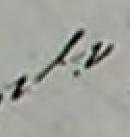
do
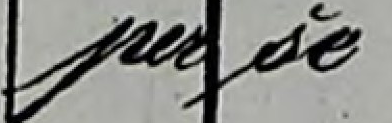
per se
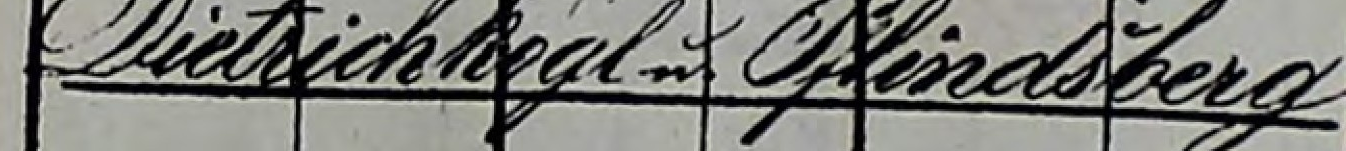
Dietrichkogl u. Pflindsberg
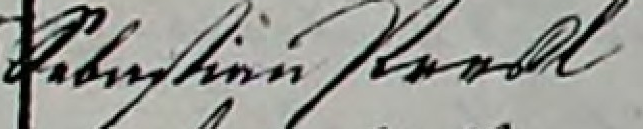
Sebastian Presl
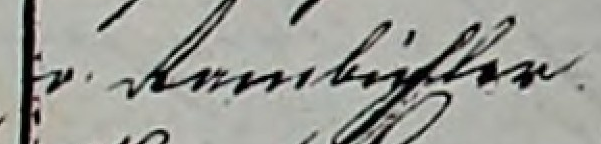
v. Rambichter
